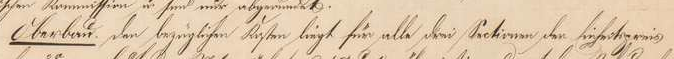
Oberbau. Den bezüglichen Kosten liegt für alle drei Sectionen der Einheitspreis
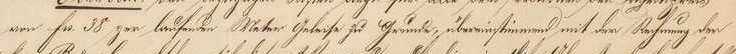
von frs. 38 per laufenden Meter Geleise zu Grunde, übereinstimmend mit der Rechnung der
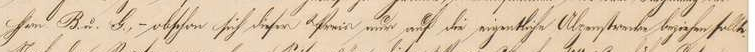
Hrn. B. u. G. – obschon sich dieser Preis nur auf die eigentliche Alpenstrecke beziehen sollte.
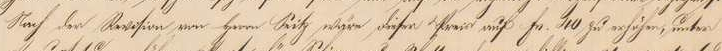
Nach der Revision von Herrn Seitz wäre dieser Preis auf frs. 40 zu erhöhen, unter
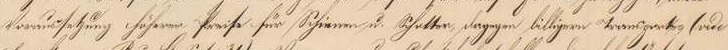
Voraussetzung höherer Preise für Schienen u. Schotter, dagegen billigern Transportes (vide
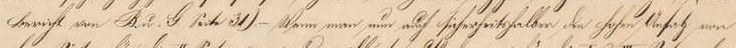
Bericht von B. u. G. Seite 31). – Wenn man nun auch sicherheitshalber den hohen Ansatz von
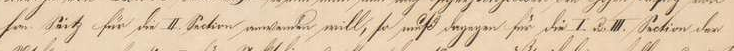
Hrn. Seitz für die II. Section anwenden will, so muß dagegen für die I. u. III. Section der
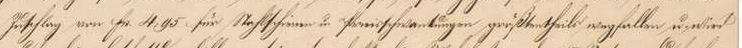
Zuschlag von frs. 4.65 für Stahlschienen u. Preisschwankungen größtentheils wegfallen u. wird
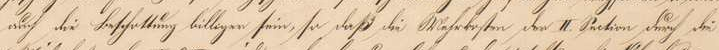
auch die Beschottung billiger sein, so daß die Mehrkosten der II. Section durch die
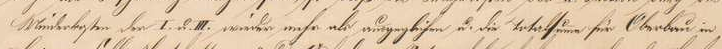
Minderkosten der I. u. III. wieder mehr als ausgeglichen u. die Totalsumme für Oberbau in
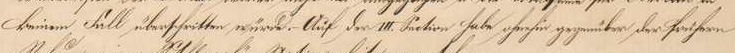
keinem Fall überschritten würde. – Auf der III. Section habe ohnehin gegenüber der frühern
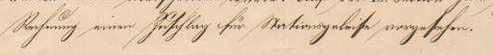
Rechnung einen Zuschlag für Stationsgeleise vorgesehen.
